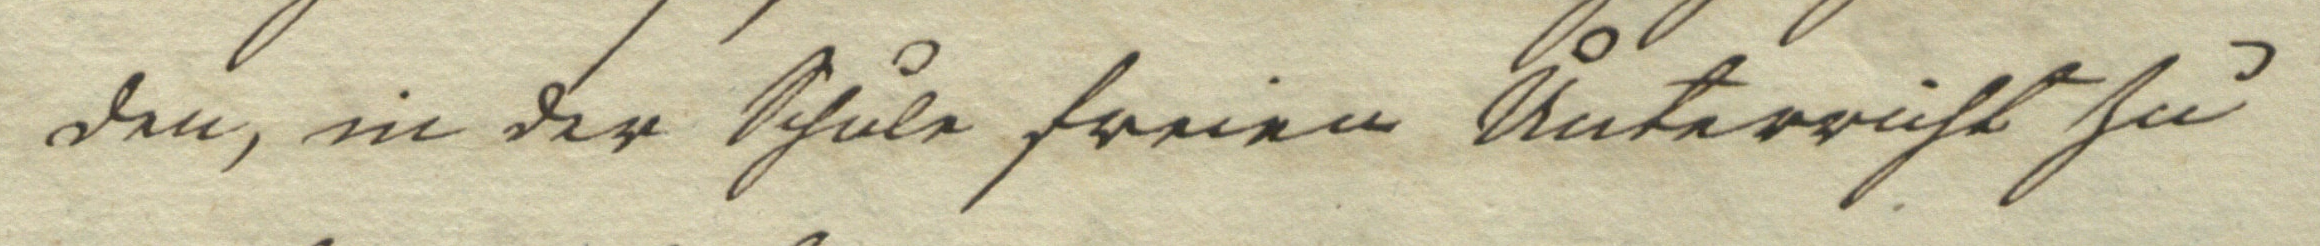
den, in der Schule freien Unterricht zu
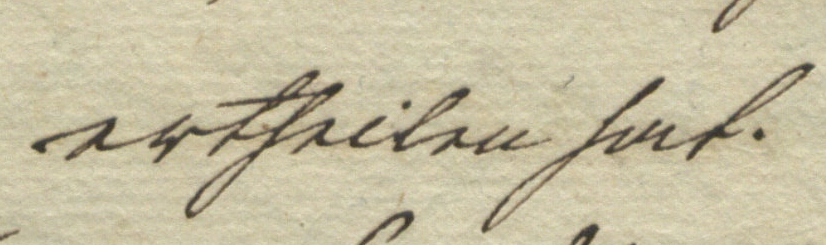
ertheilen hat.
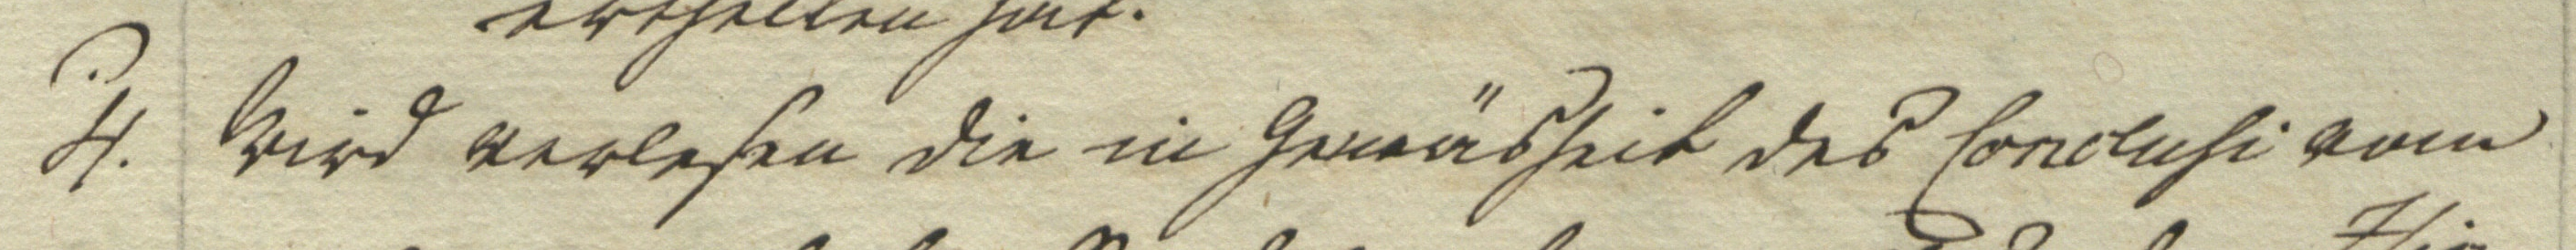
4. Wird verlesen die in Gemäsheit des Conclusi vom
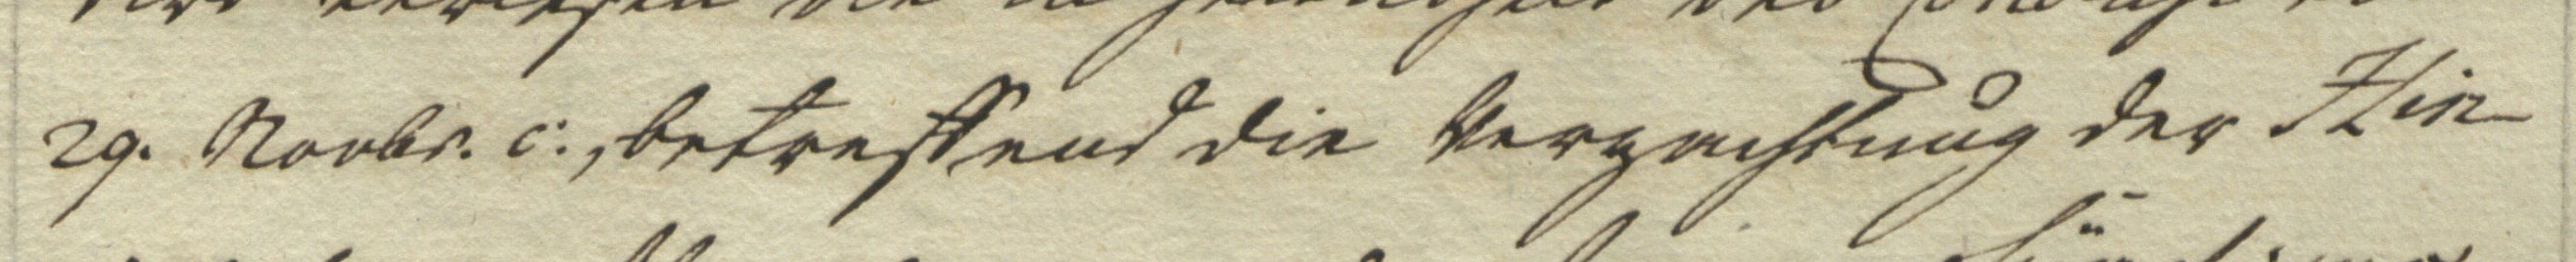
29. Novbr. c. betreffend die Verpachtung der Hin¬
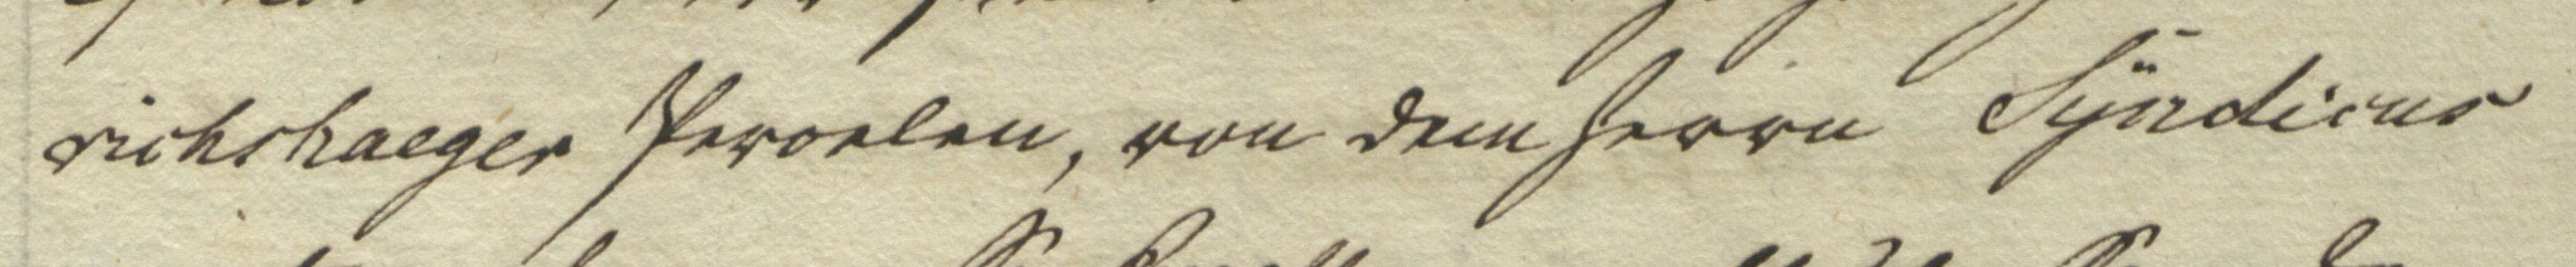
richshaeger Percelen, von dem Herrn Sÿndicus
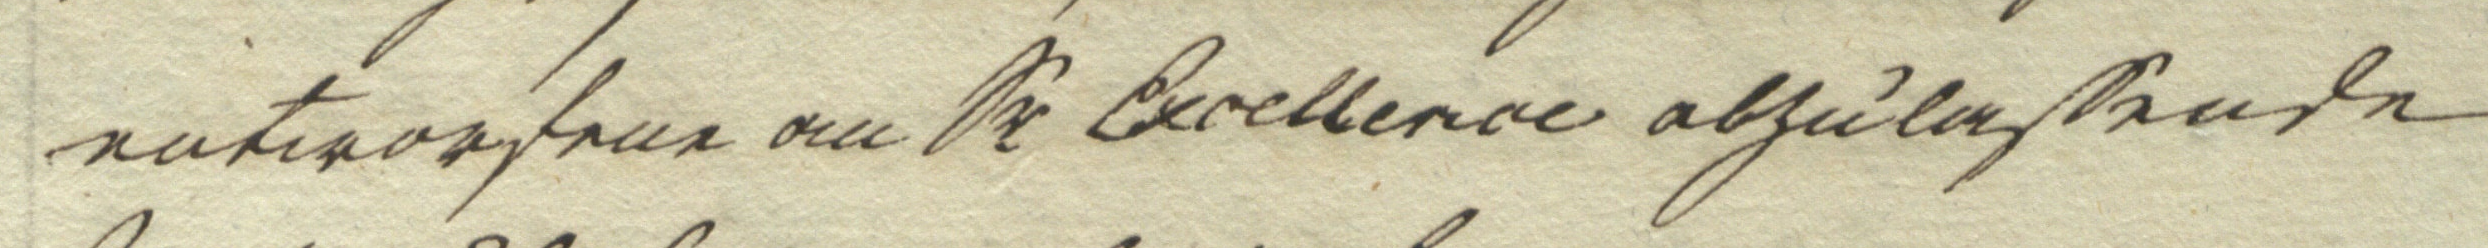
entworfene an Sr Excellence abzulassende
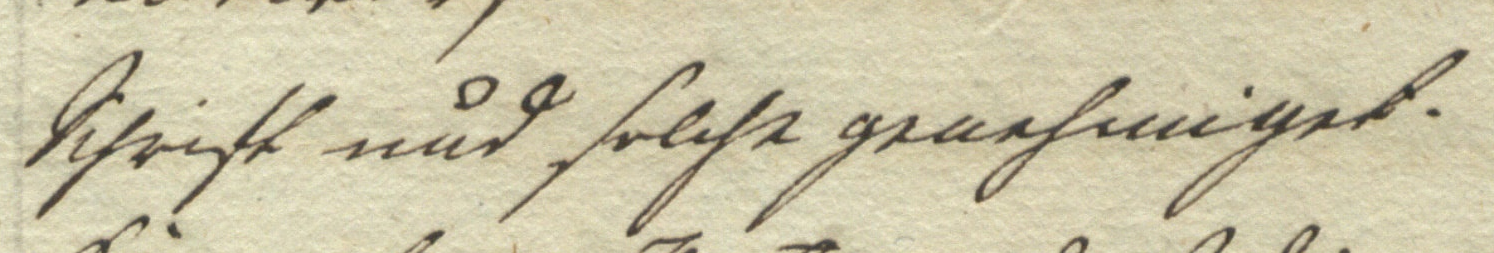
Schrift und solche genehmiget.
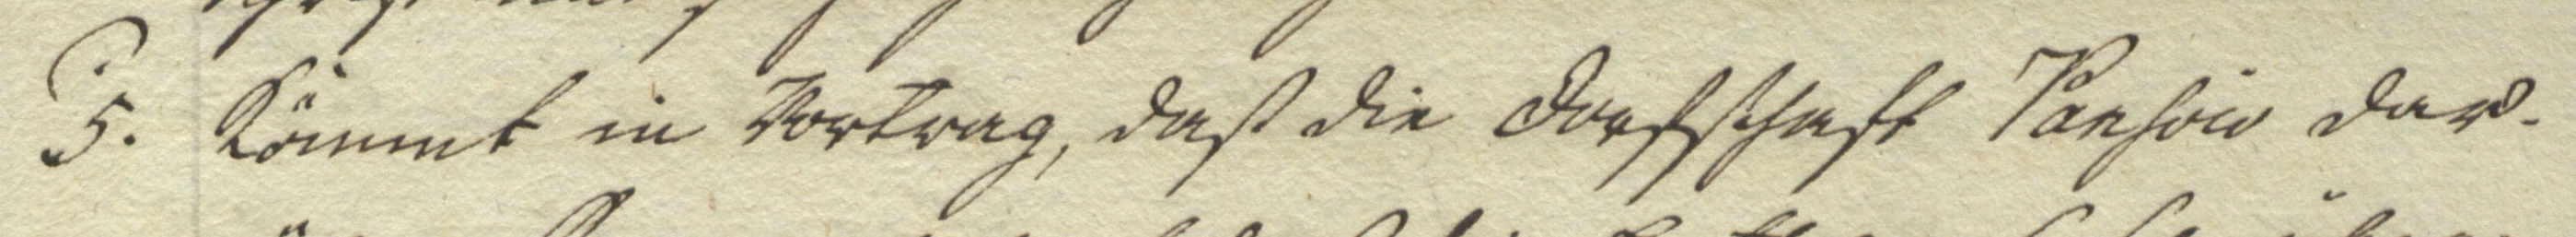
5. Kömmt in Vortrag, daß die Dorfschaft Pansow dar¬
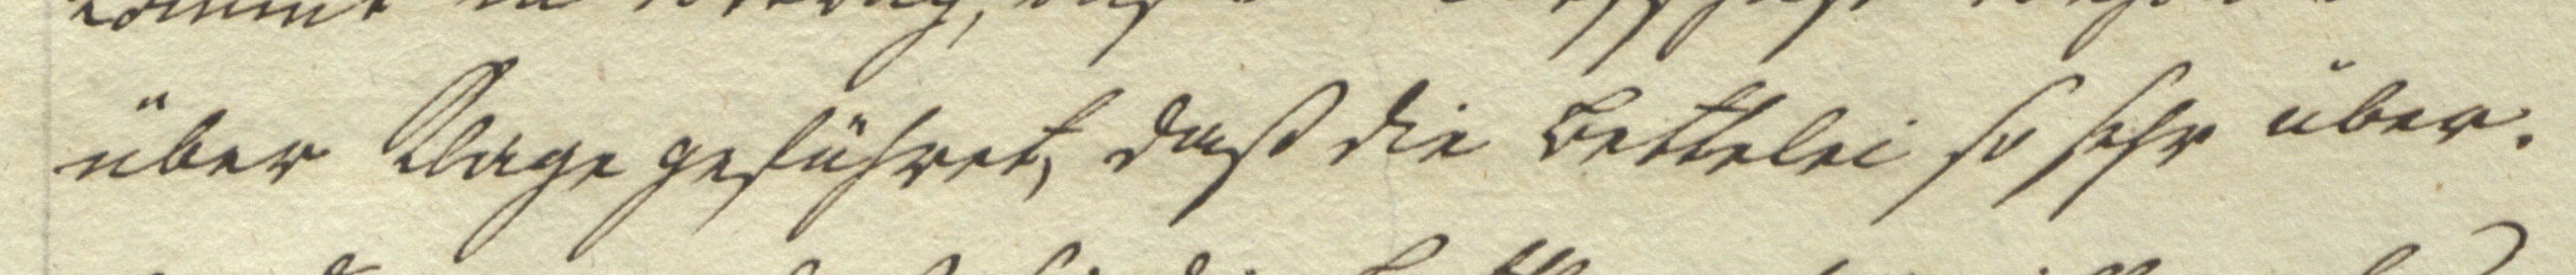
über Klage geführet, daß die Bettelei so sehr über¬
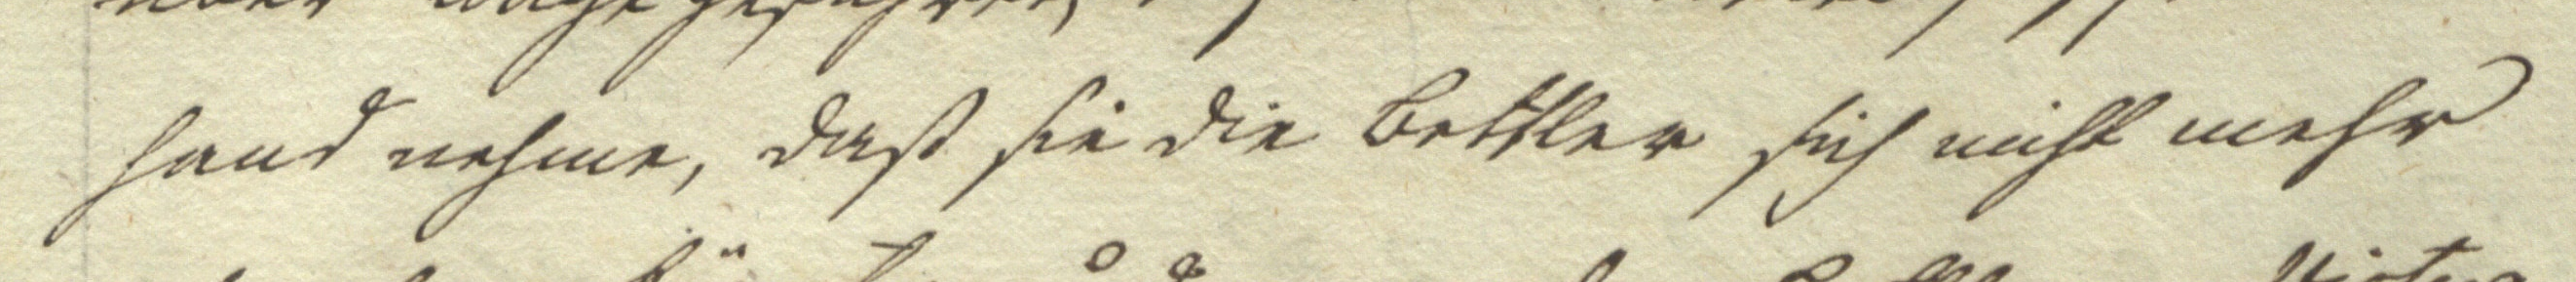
hand nehme, daß sie die Bettler sich nicht mehr
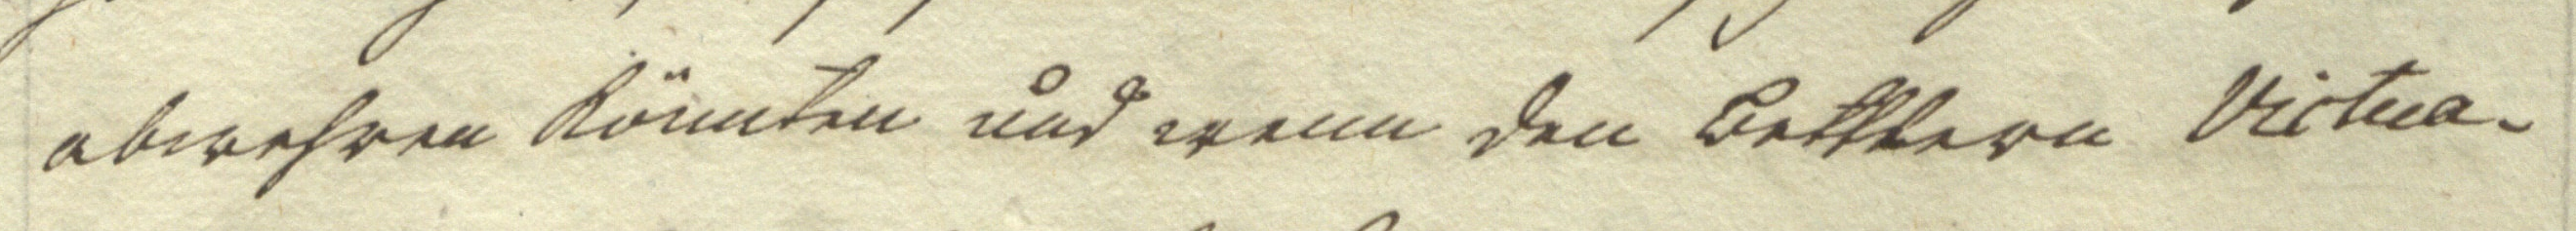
abwehren könnten und wenn den Bettlern Victua¬
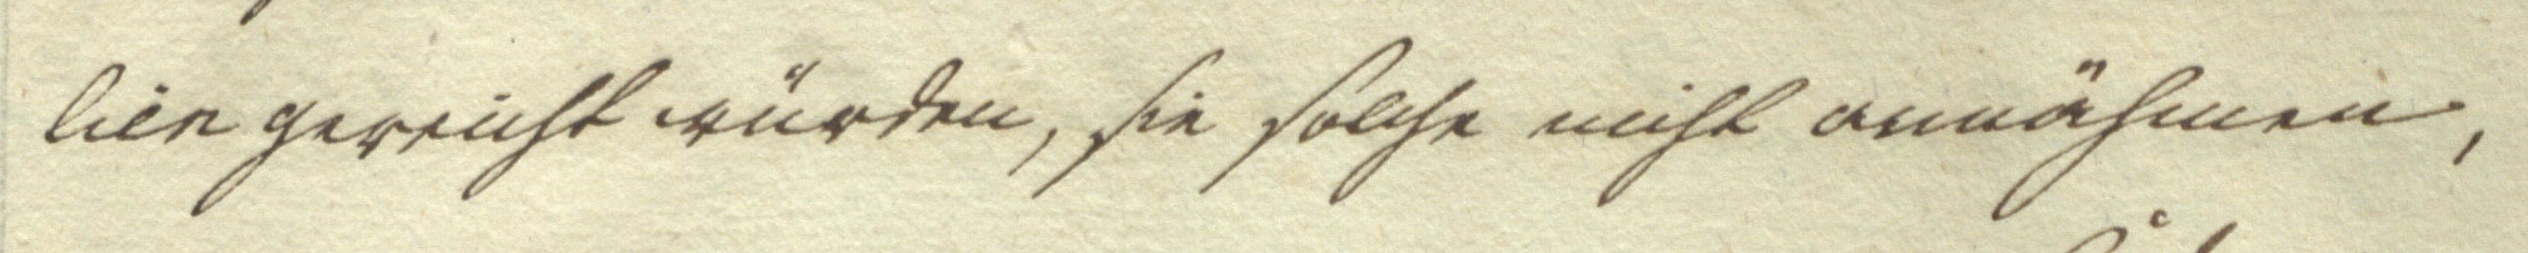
lien gereicht würden, sie solche nicht annähmen,
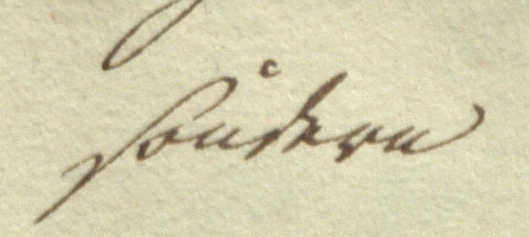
sondern
